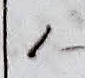1
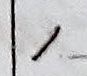1
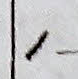1
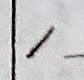1
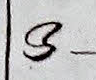3
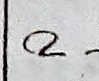2
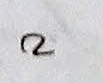2
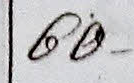60
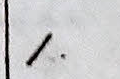1.
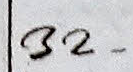32
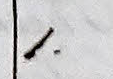1.
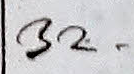32
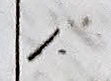1.
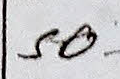50
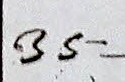35
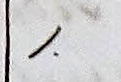1.
